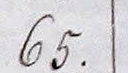65.
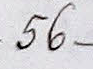56
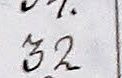32
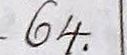64.
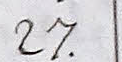27.
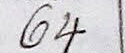64
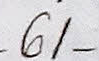61
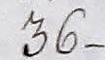36
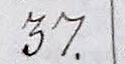37.
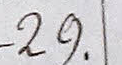29.
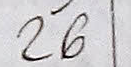26
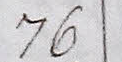76
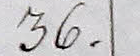36.
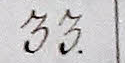33.
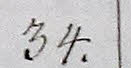34.
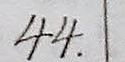44.
